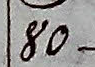80
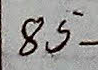85
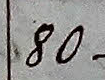80
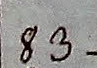83
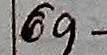69
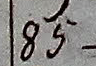85
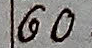60
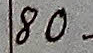80
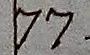77
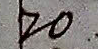70
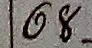68
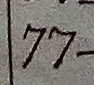77
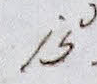15
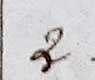2
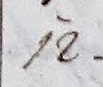12
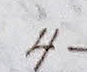4
